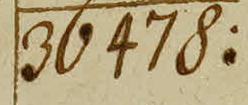36478
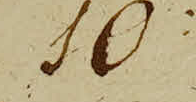10
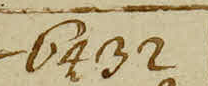6432
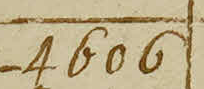4606
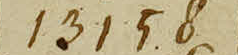13158
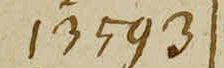13593
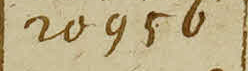20956
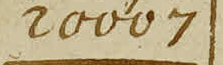20007
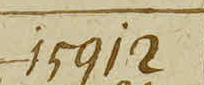15912
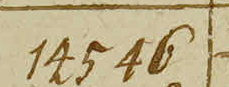14546
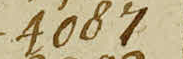4087
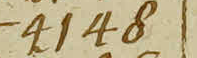4148
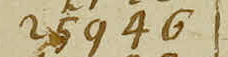25946
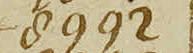8992
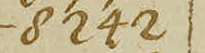8242
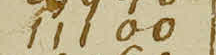11100
